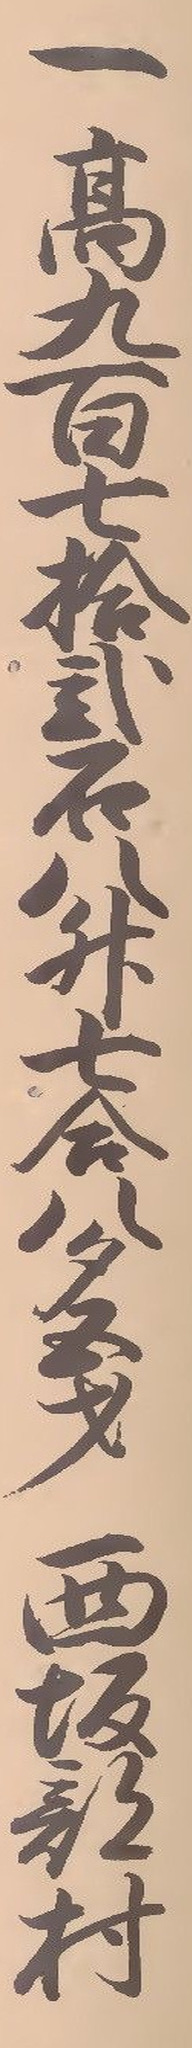一高九百七拾弐石八升七合八勺五才西坂部村
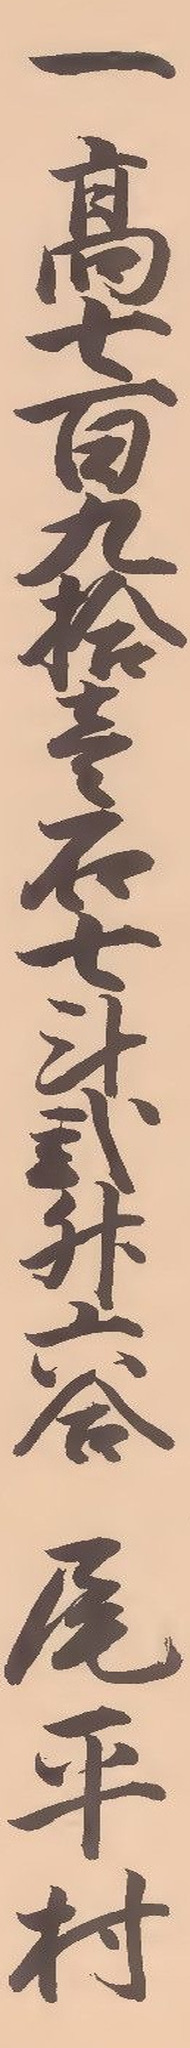一高七百九拾壱石七斗弐升六合尾平村
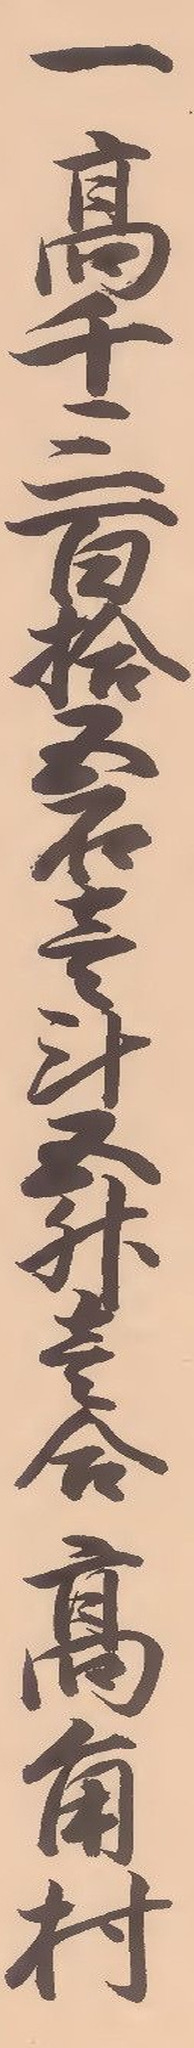一高千三百拾五石壱斗五升壱合高角村
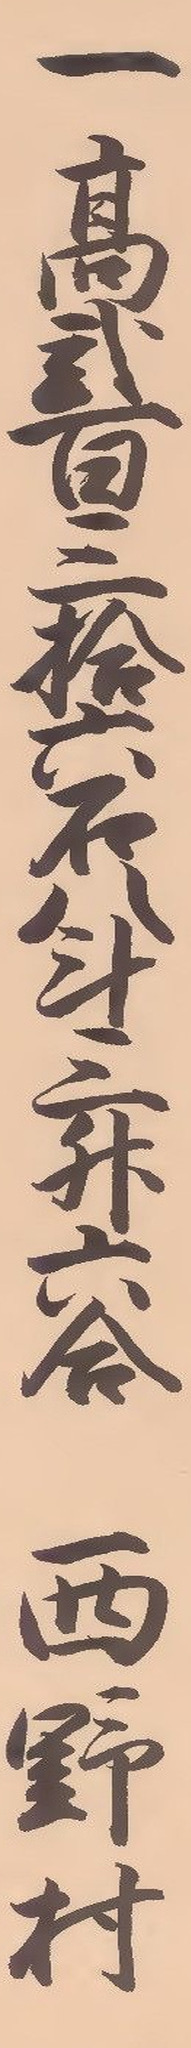一高弐百三拾六石八斗三升六合西野村

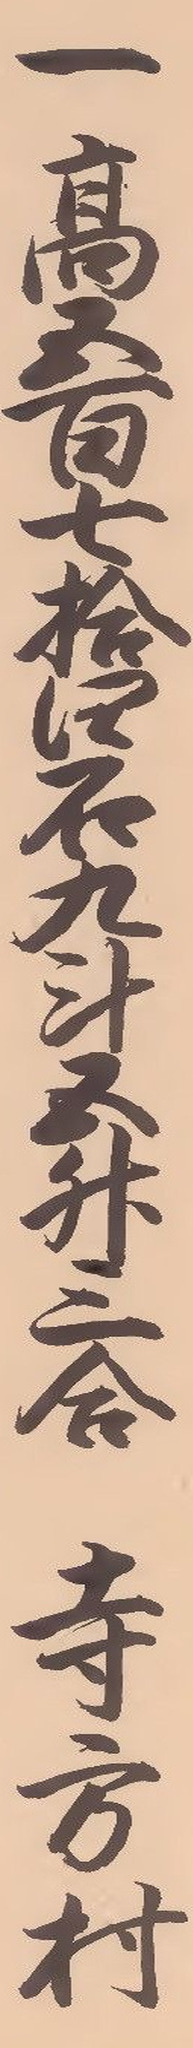一高五百七拾四石九斗五升三合寺方村
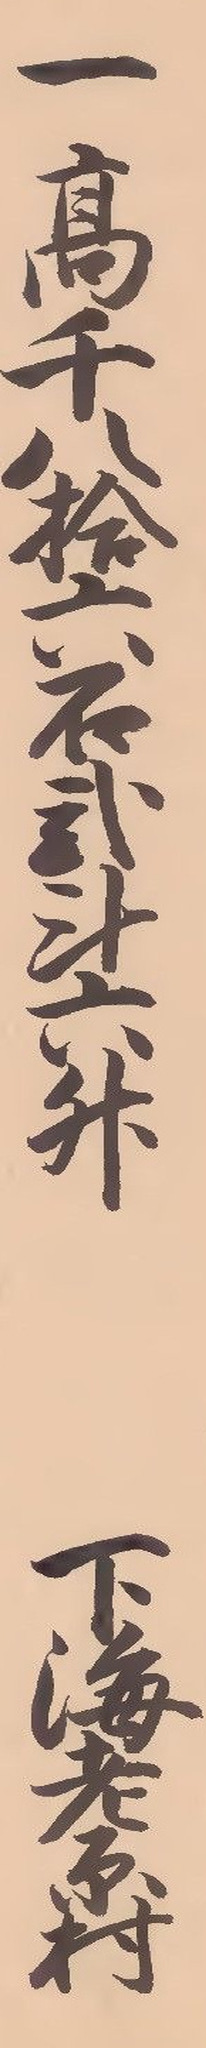一高千八拾六石弐斗六升下海老原村
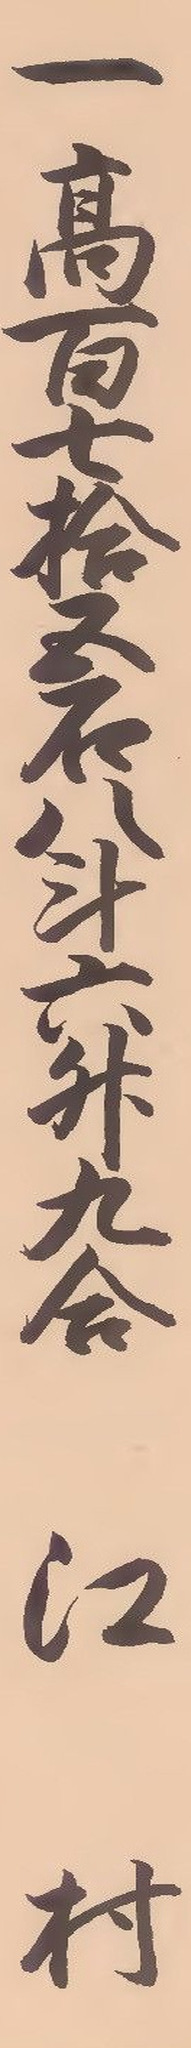一高百七拾五石八斗六升九合江村
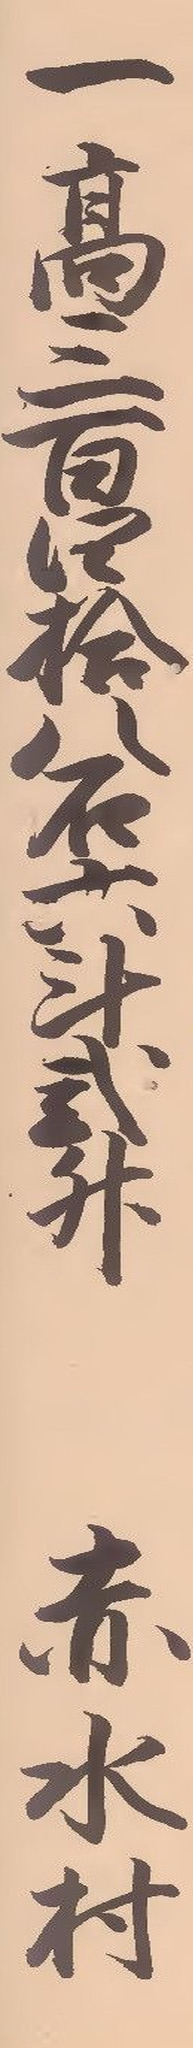一高三百四拾八石六斗弐升赤水村
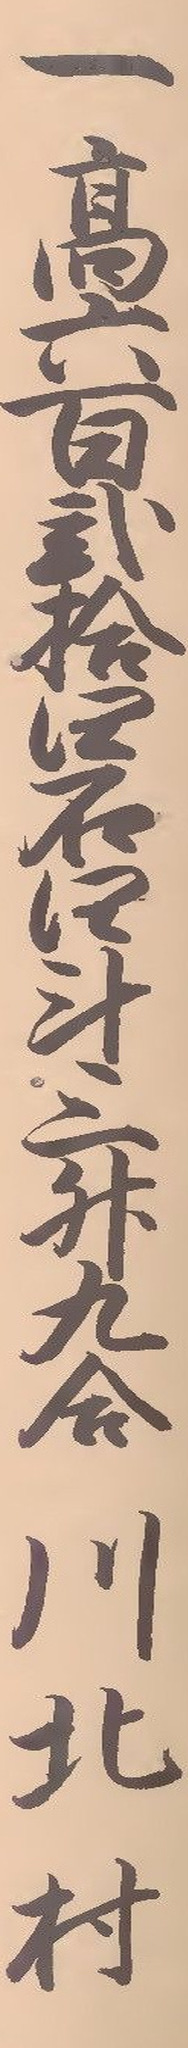一高六百弐拾四石四斗三升九合川北村
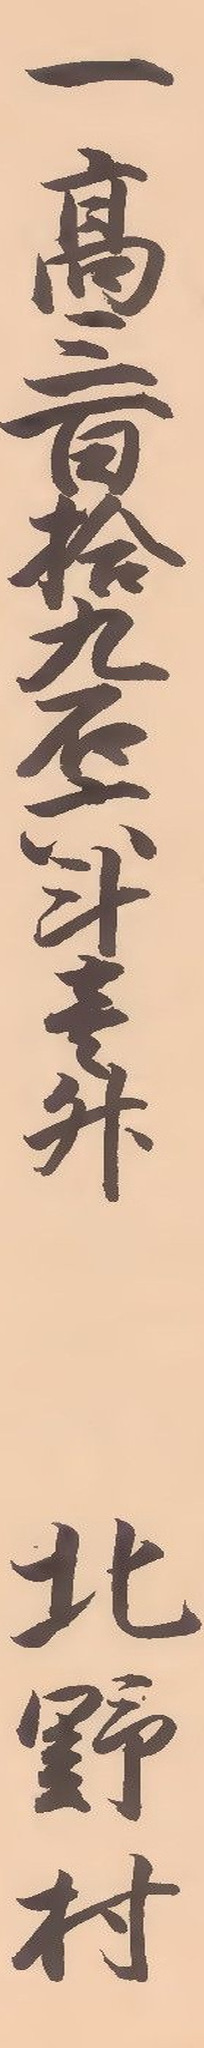一高三百拾九石六斗壱升北野村
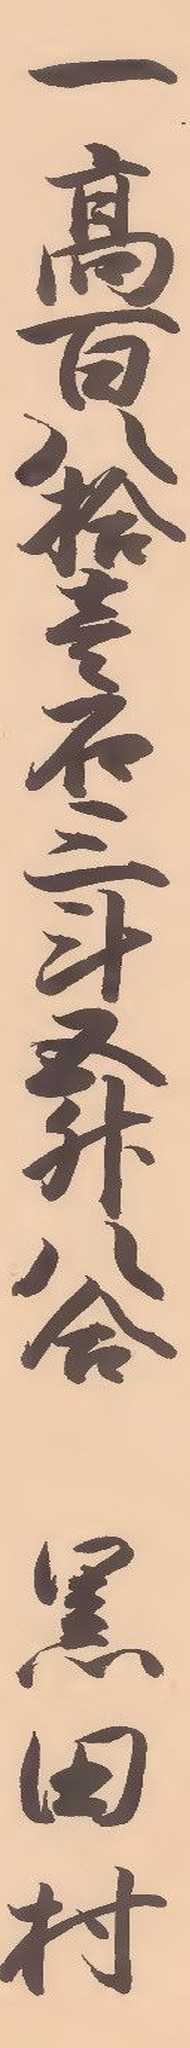一高百八拾壱石三斗五升八合黒田村
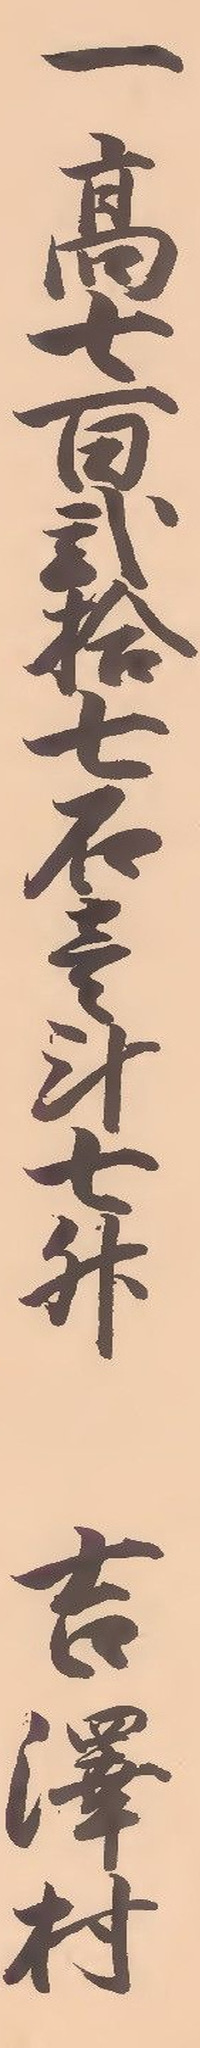一高七百弐拾七石壱斗七升吉沢村

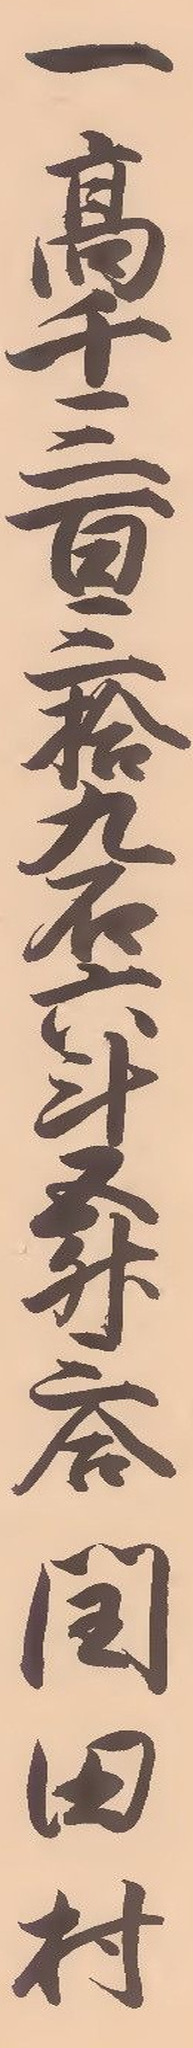一高千三百三拾九石六斗五升三合閏田村
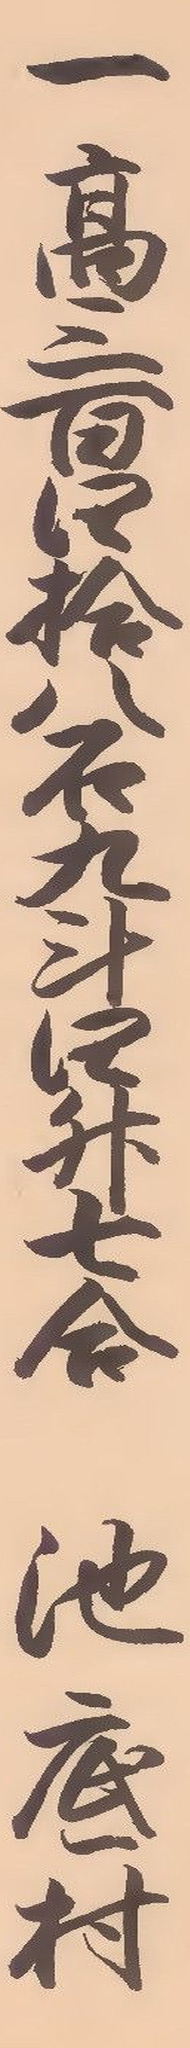一高三百四拾八石九斗四升七合池底村
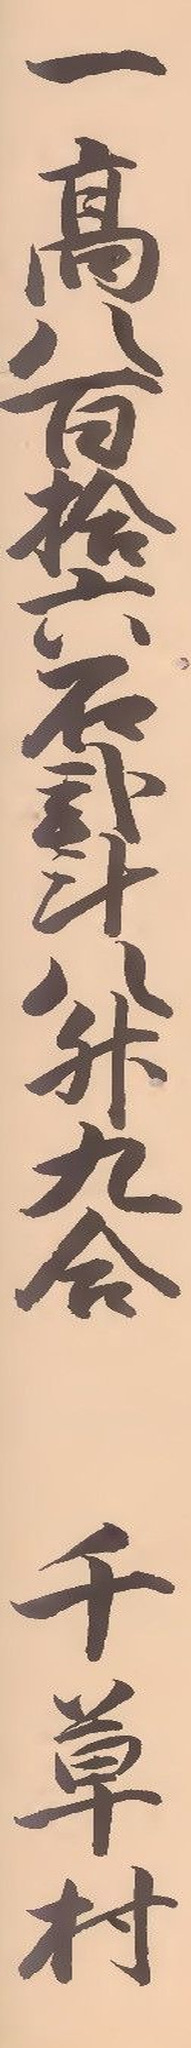一高八百拾六石弐斗八升九合千草村
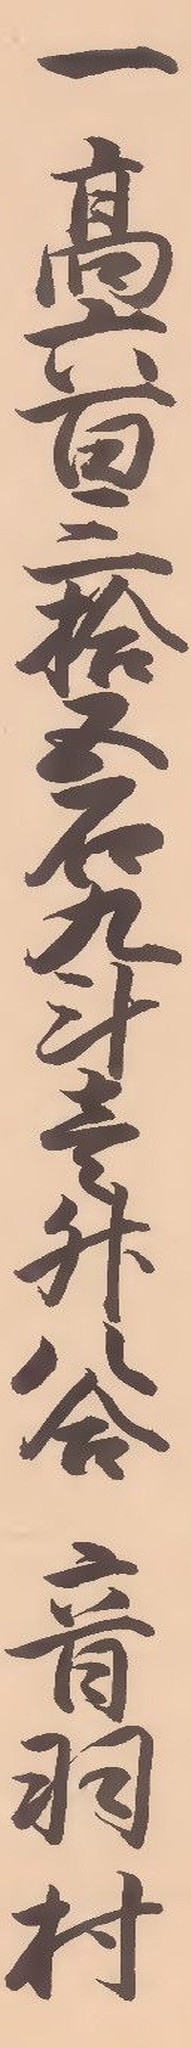一高六百三拾五石九斗壱升八合音羽村
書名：伊勢国郷帳
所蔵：国立公文書館 National Archives of Japan
